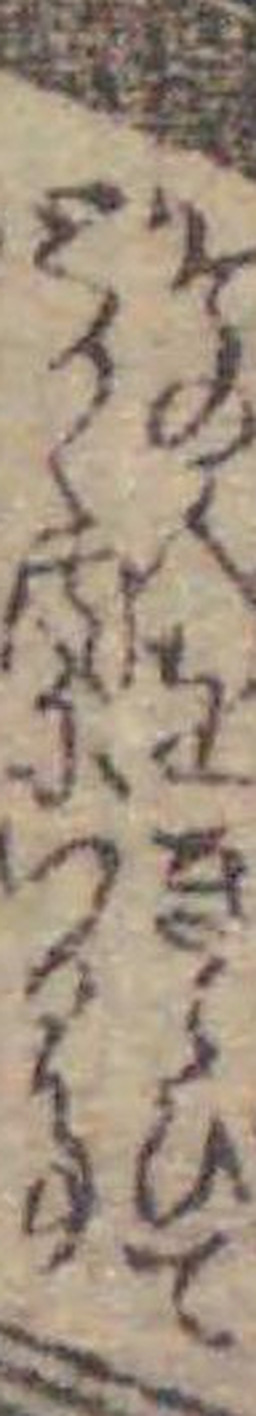とかく内にいる事
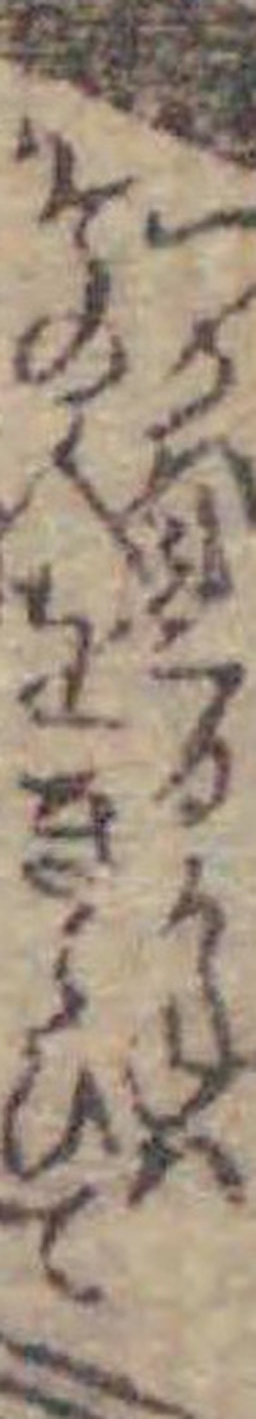その人をきらひて
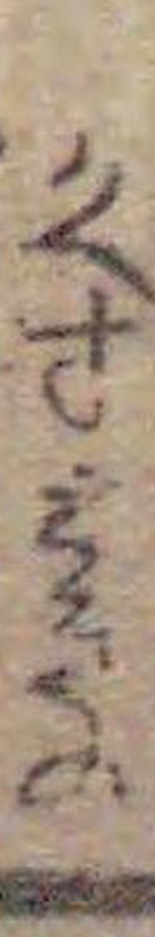かへすときの
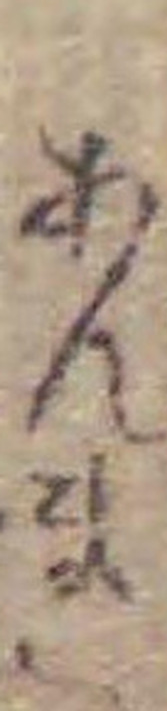あんま
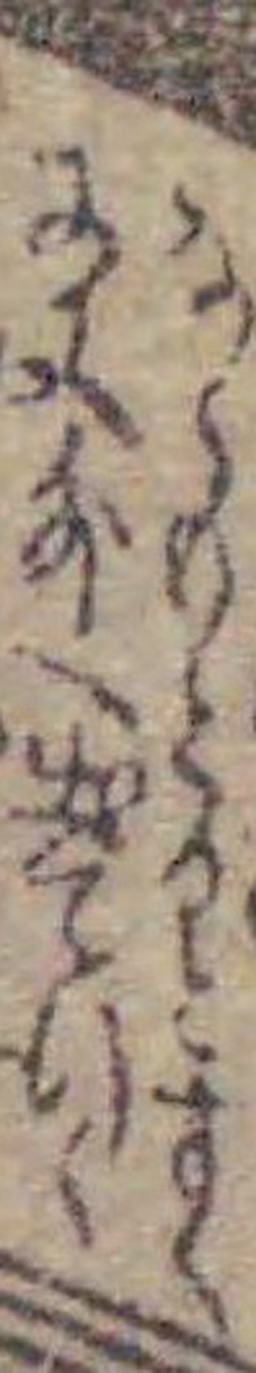に又外へ出て行く
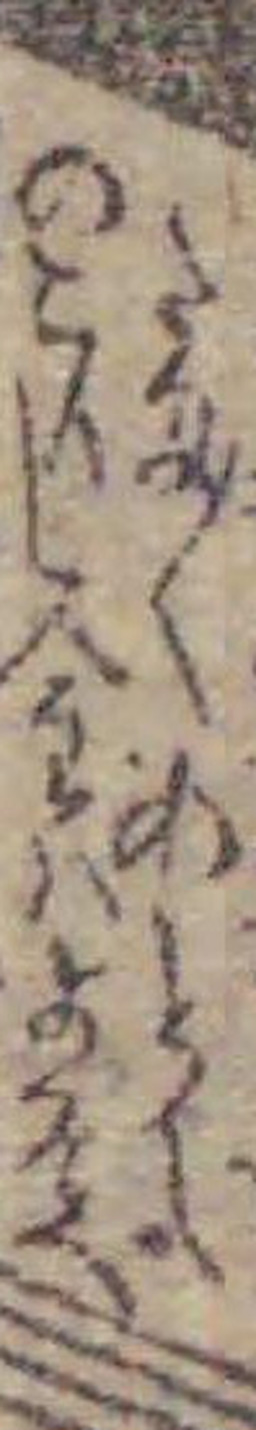のこりし金はよそへ
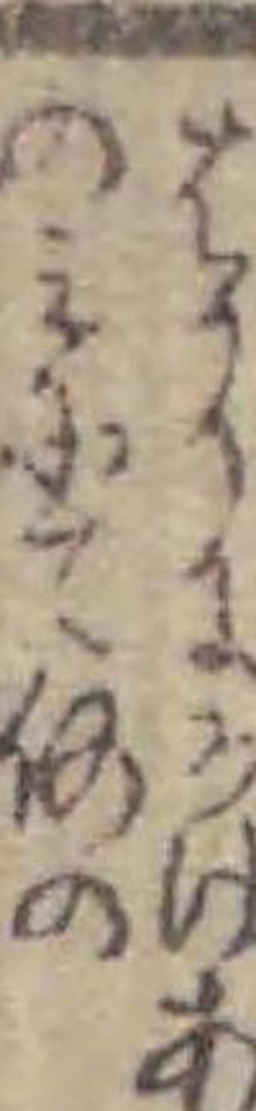のみにて何の
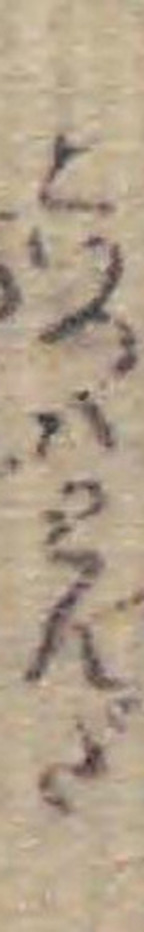こいつはとんだ
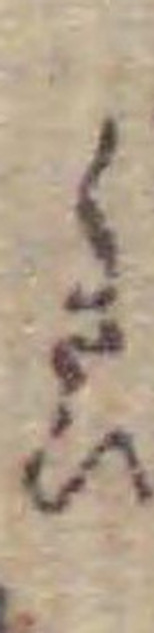くさい
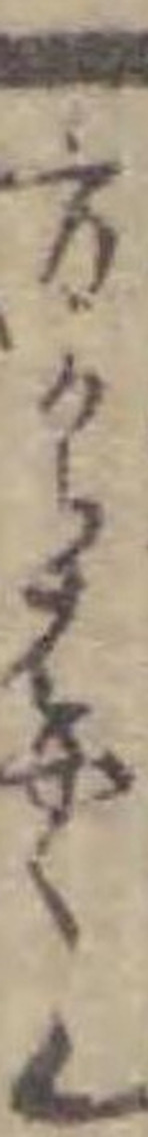方からはやく
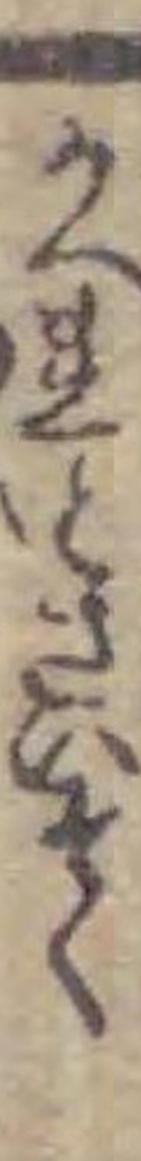かへれとさいそく
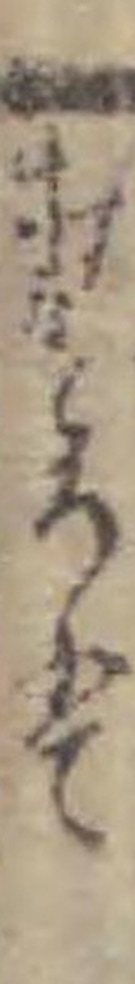打そろふて
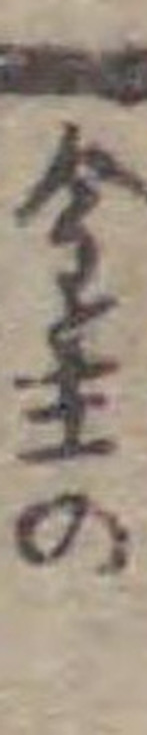金主の
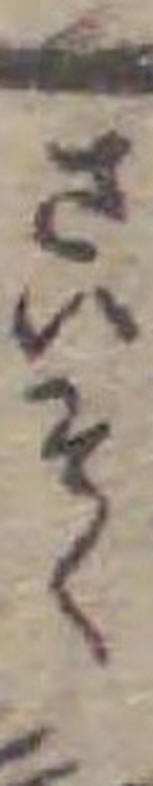さいそく
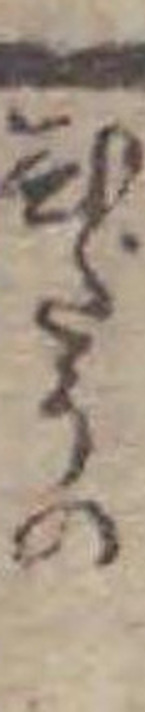ひだうの

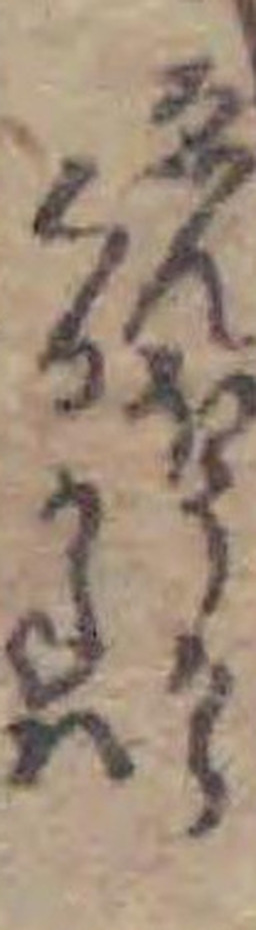くるかねは
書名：新鋳小判 : 3巻
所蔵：国立国会図書館 National Diet Library, JAPAN
